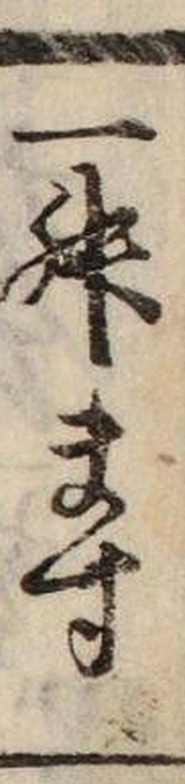一舛ます
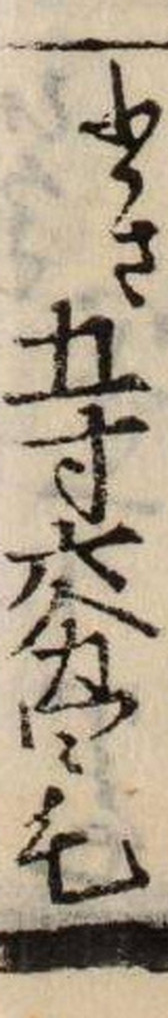ふかさ五寸六分四毛

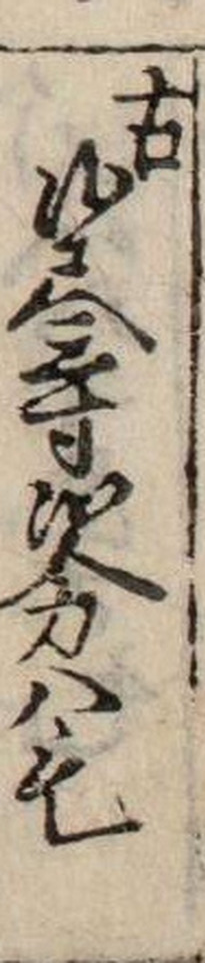古弐尺三寸弐分八毛
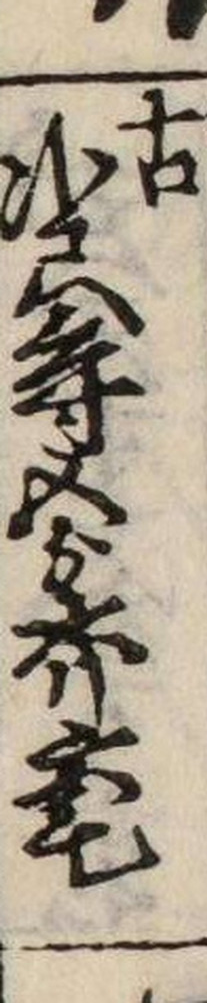古弐尺六寸五分六り六毛
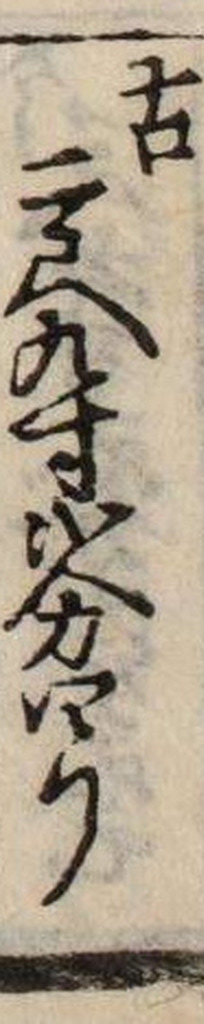古二尺九寸弐分四り
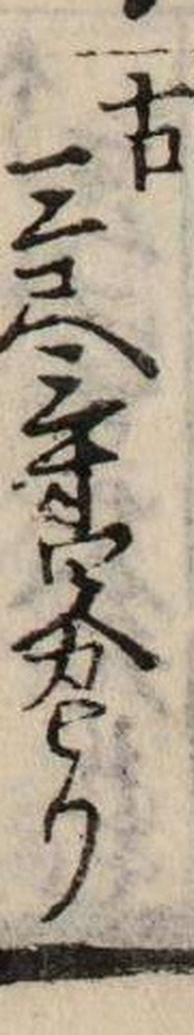古三尺三寸四分七り
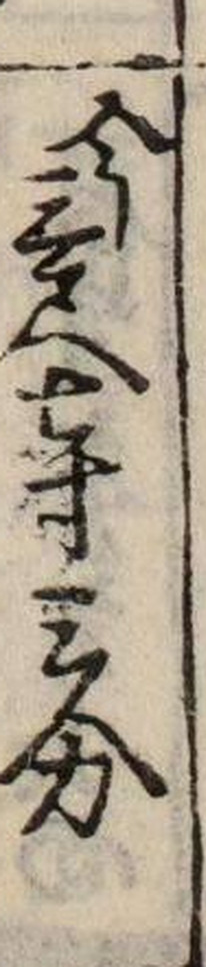八石今三尺七寸三分
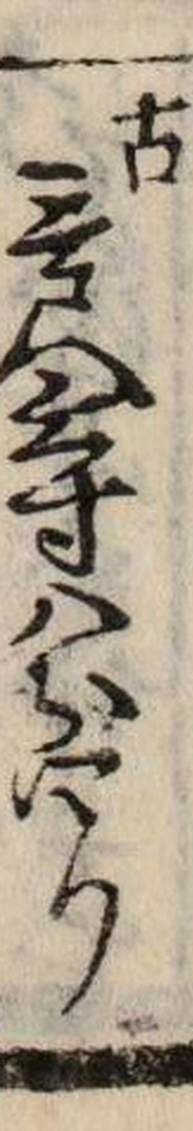古三尺六寸八分四り
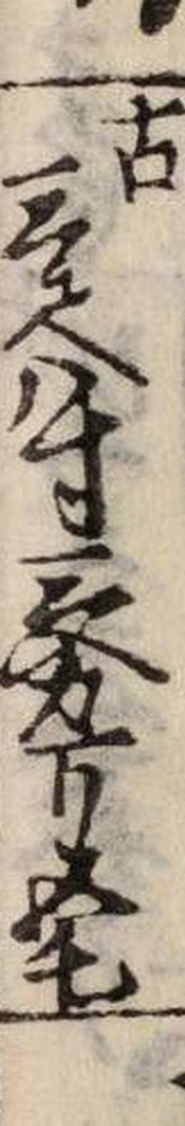古三尺八寸三分一り五毛
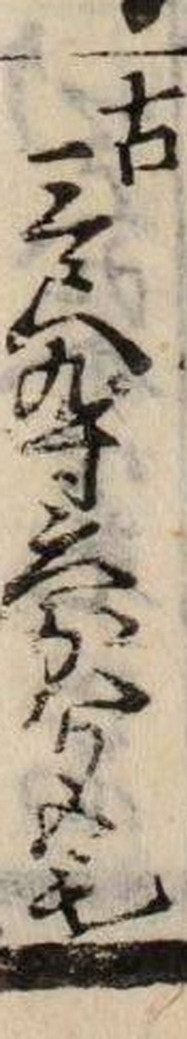古三尺九寸六分八り五毛
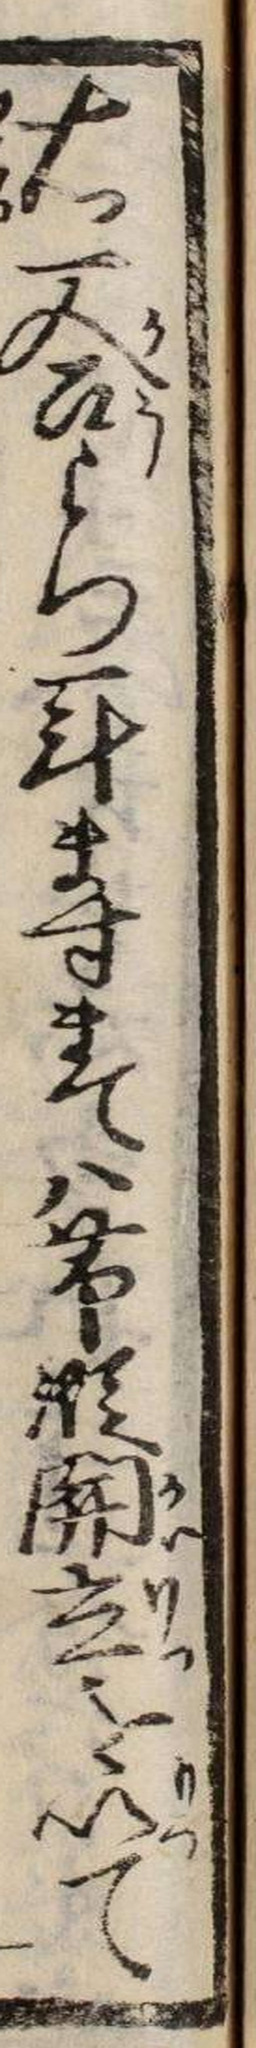右一合より一斗ますまては帯縦開立を以て
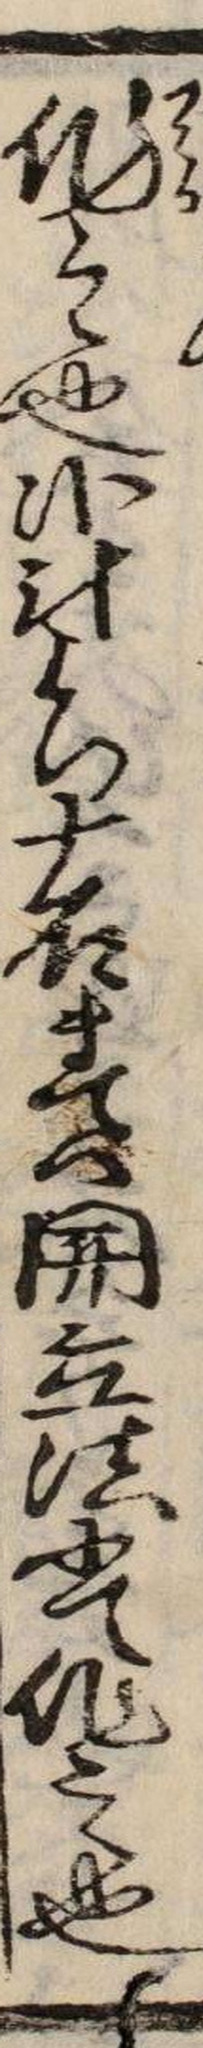作之也弐斗より十石まては開立法にて作之也
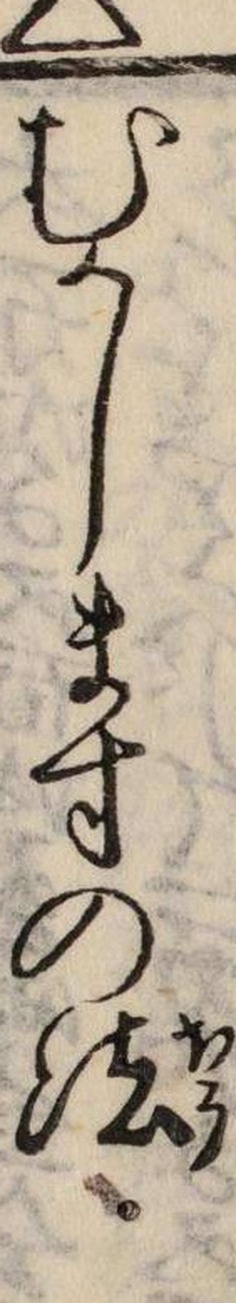△むかしますの法

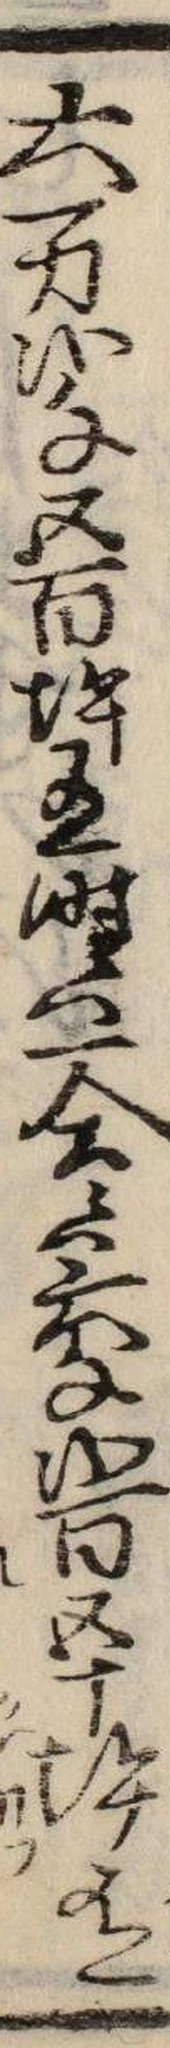六万弐千五百坪有時は一合には六千弐百五十坪有
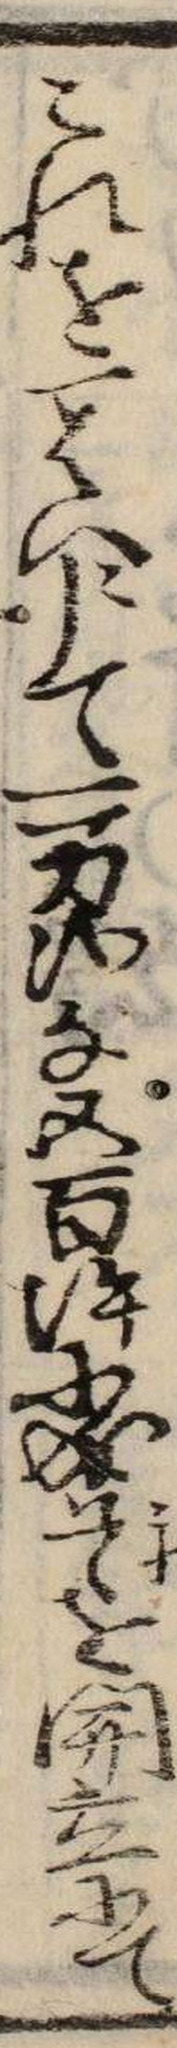これを一はいにして一万弐千五百坪に成是を開立にて
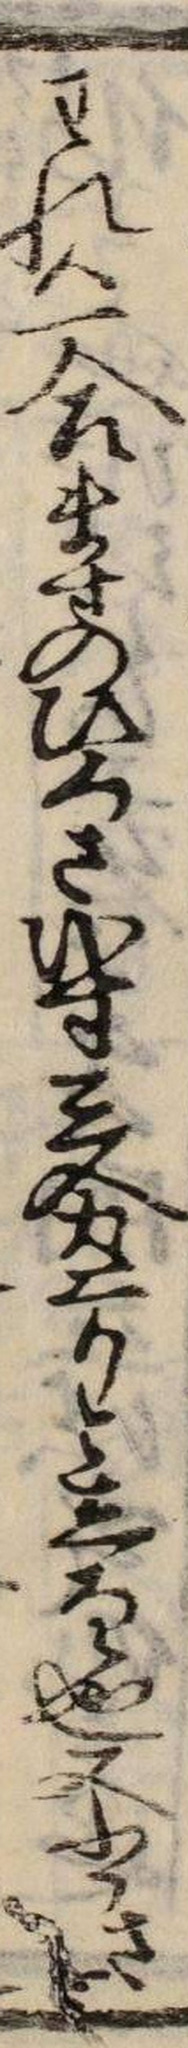われは一合ますのひろさ弐寸三分二りとしるる也又ふかさ
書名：塵劫記（寛永11年自跋、京都府立京都学・歴彩館追貴8）
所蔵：京都府立京都学・歴彩館 国文学研究資料館
